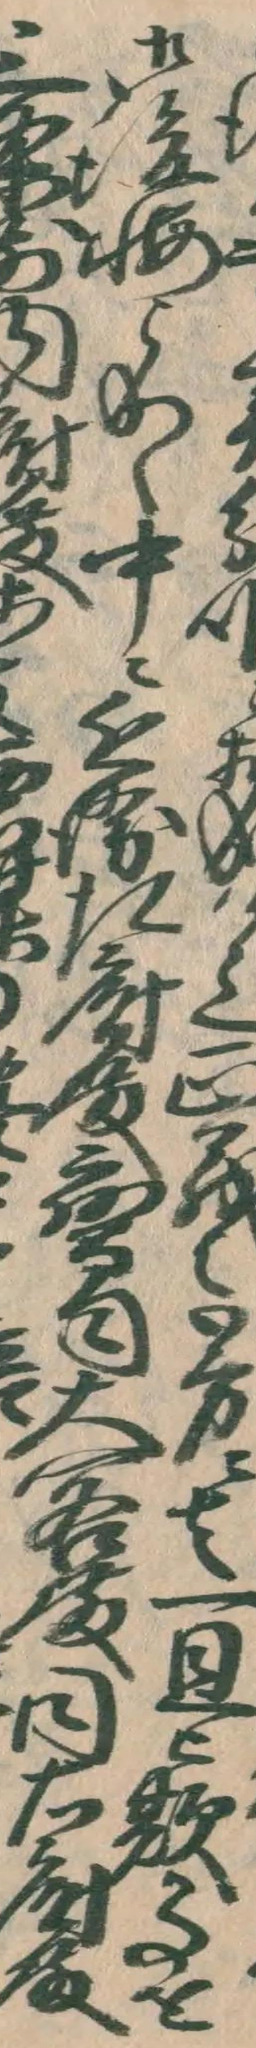御後悔被成候中ニ近衛左府殿鷹司大閤殿同右府殿
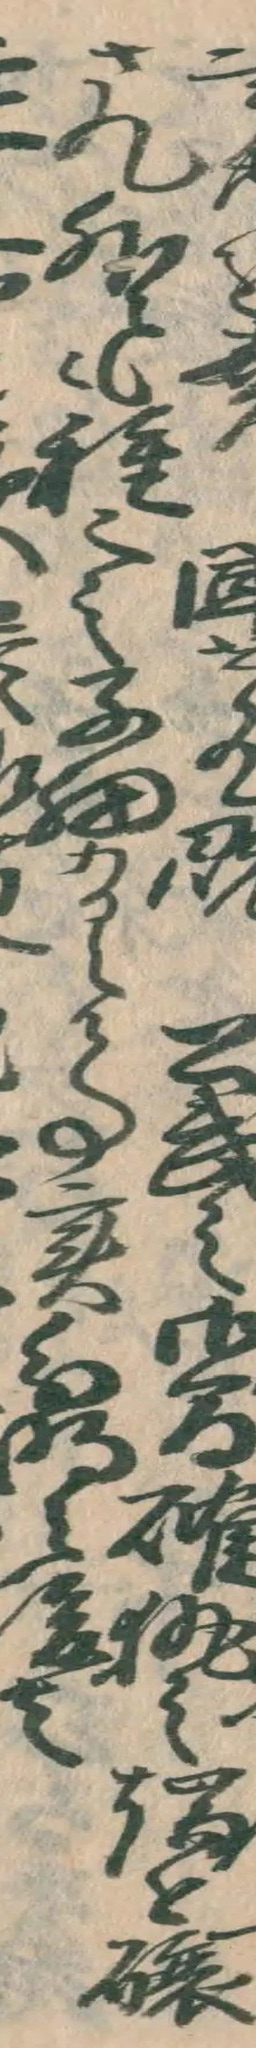され外ニも種々之子細有之候事実分明之後者
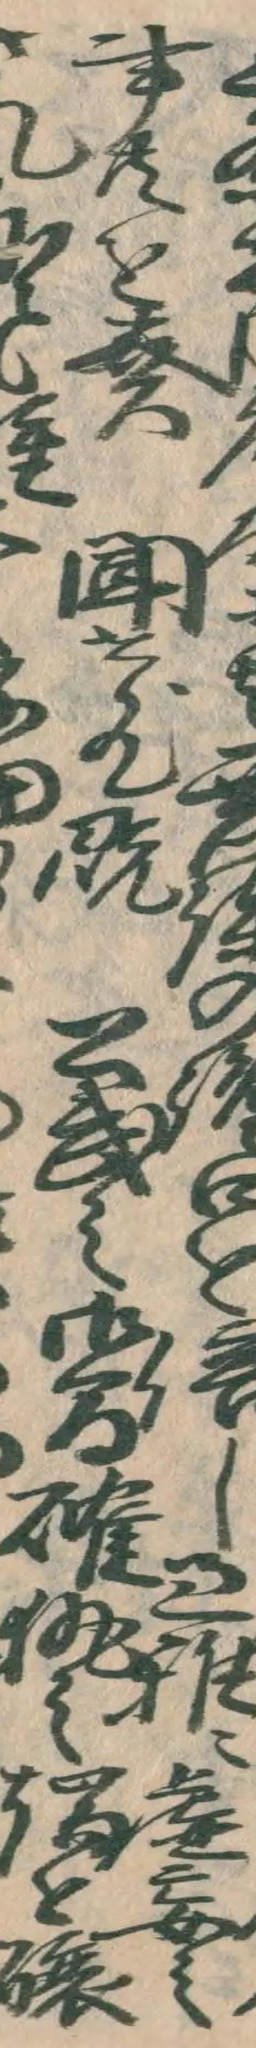事共を奏聞せられ既公武之御間確執之端を醸
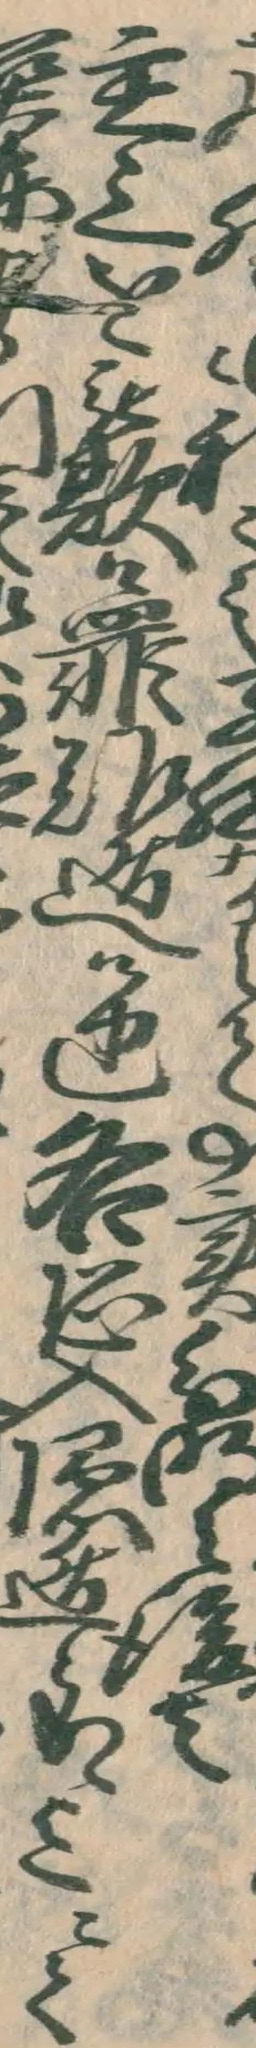主上を被欺候罪難遁候迚各恐入隠遁被成候迄ニて
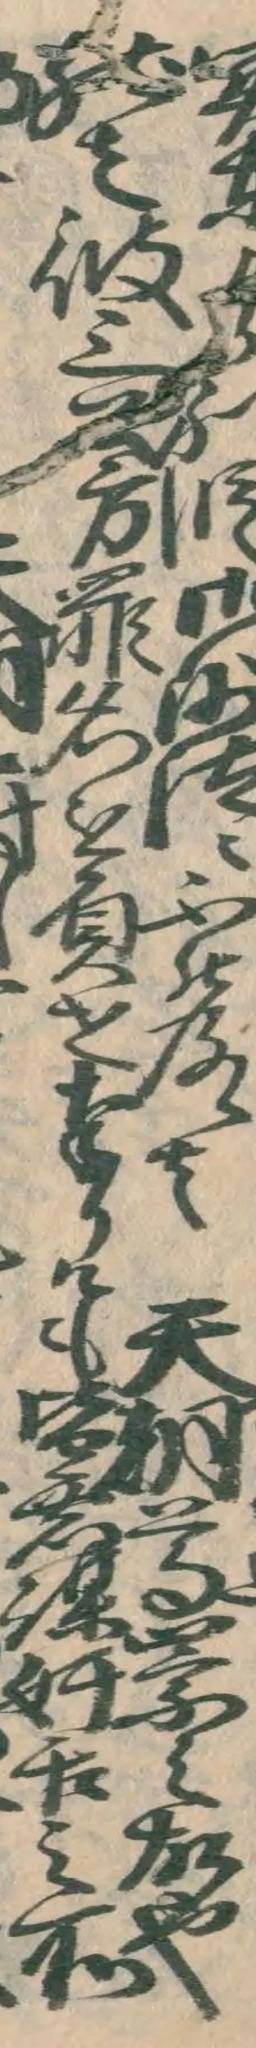然者彼三公方罪名を負せ奉り候も皆悪謀奸舌之所
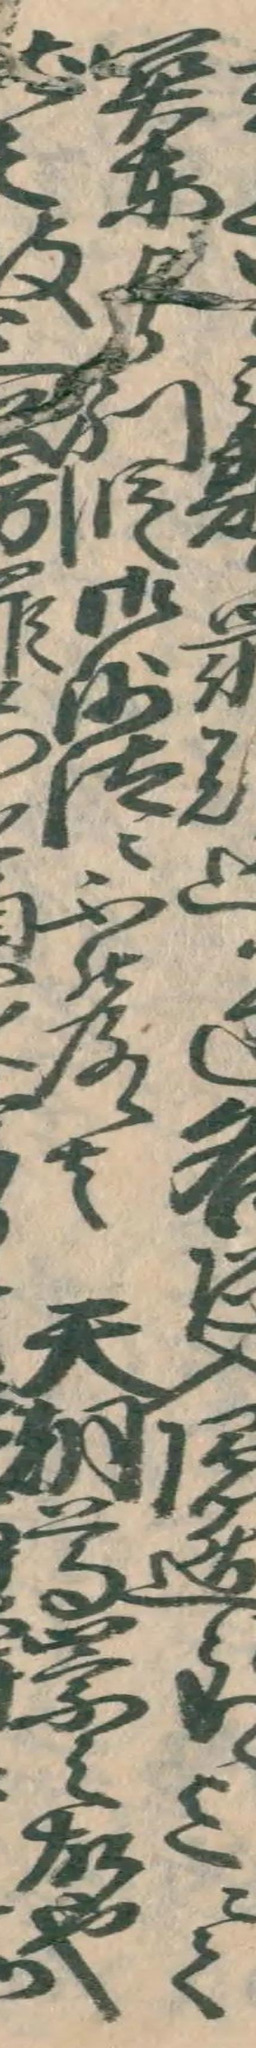関東より別段御沙汰ニ不被及候者天朝尊崇之故や
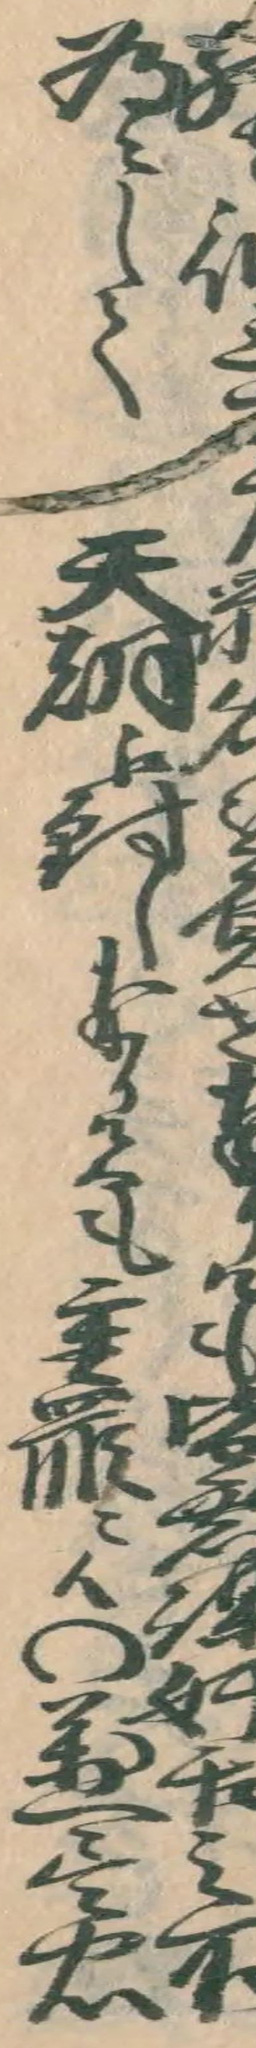為ニして天朝江對し奉り候而も重罪ニ候〇萬一尽忠

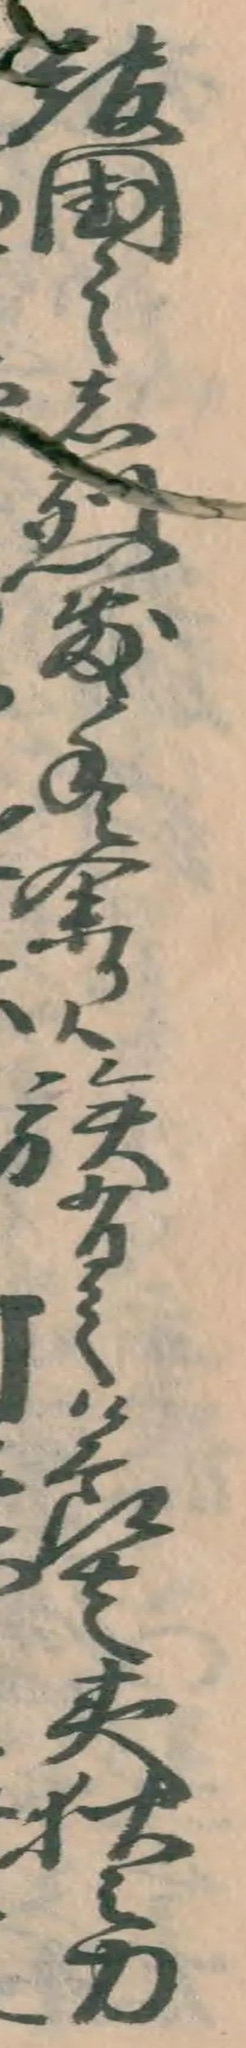報国之志烈敷手ニ余り候族有之候節者夷狄之力
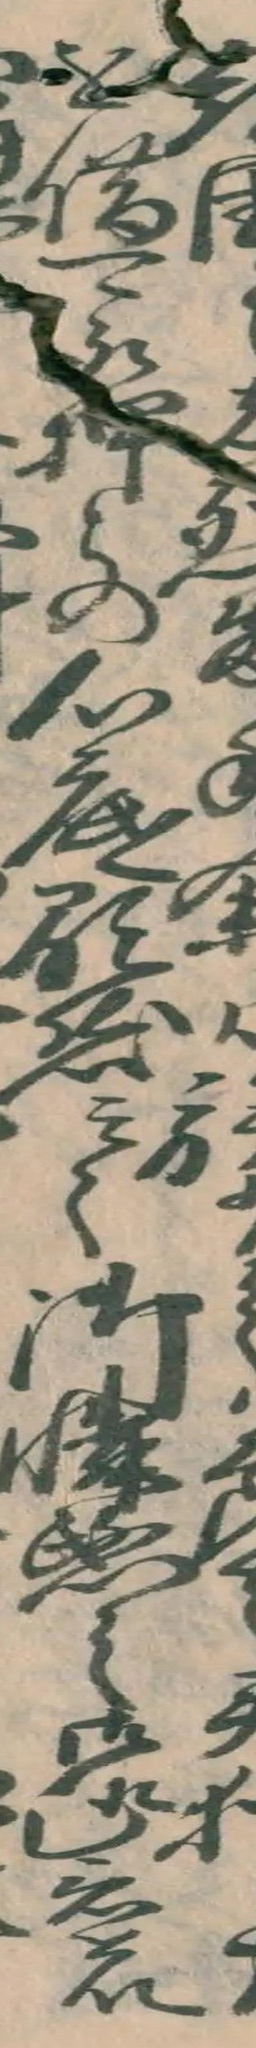を借可取押との心底顕然云々御憐愍之御趣意を以
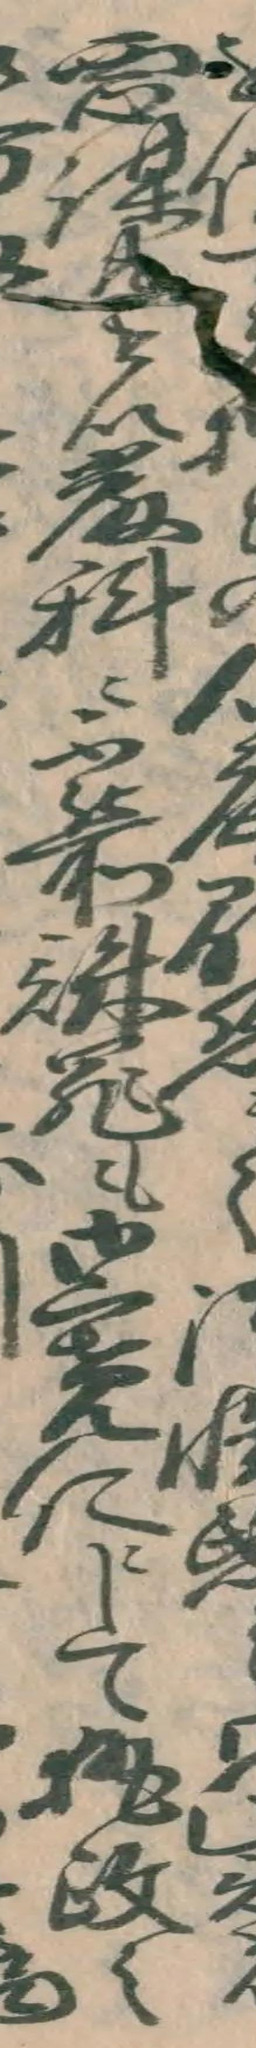悪謀共を以厳科ニ不被所誅罪も御寛仁二して執政之
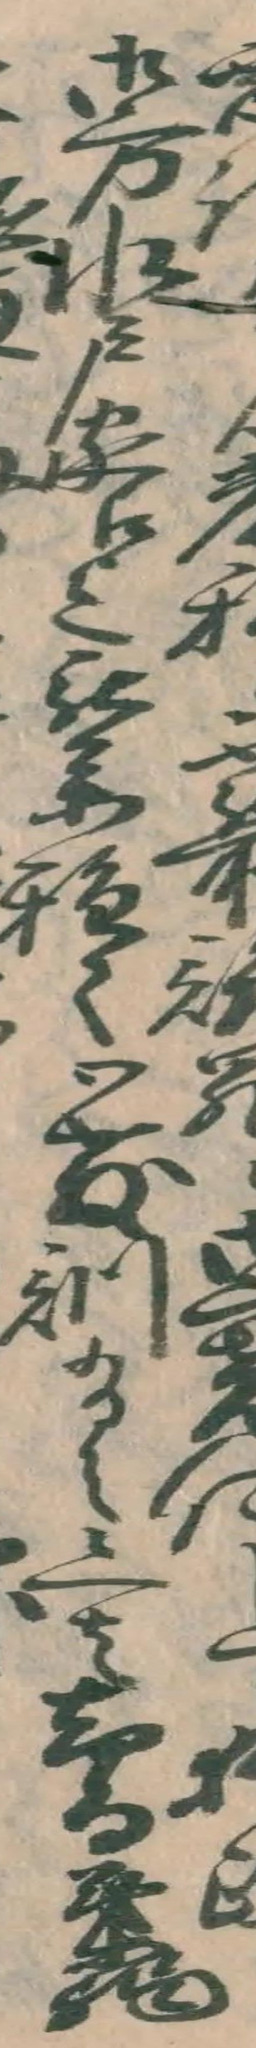御方水戸家江迄被参種々御教訓有之候へ共却而柔弱
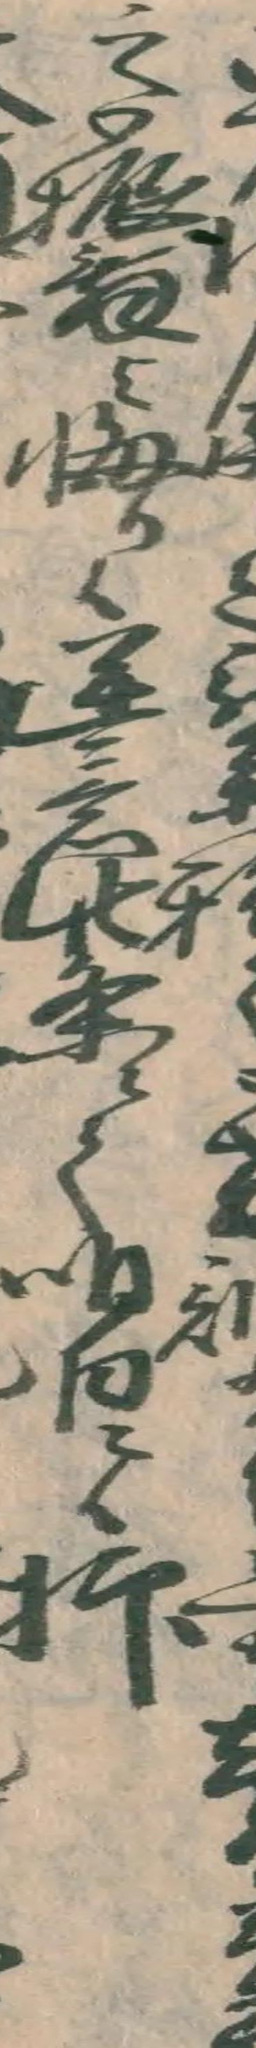之御振舞と侮り候逆意此条ニて明白ニ候抑
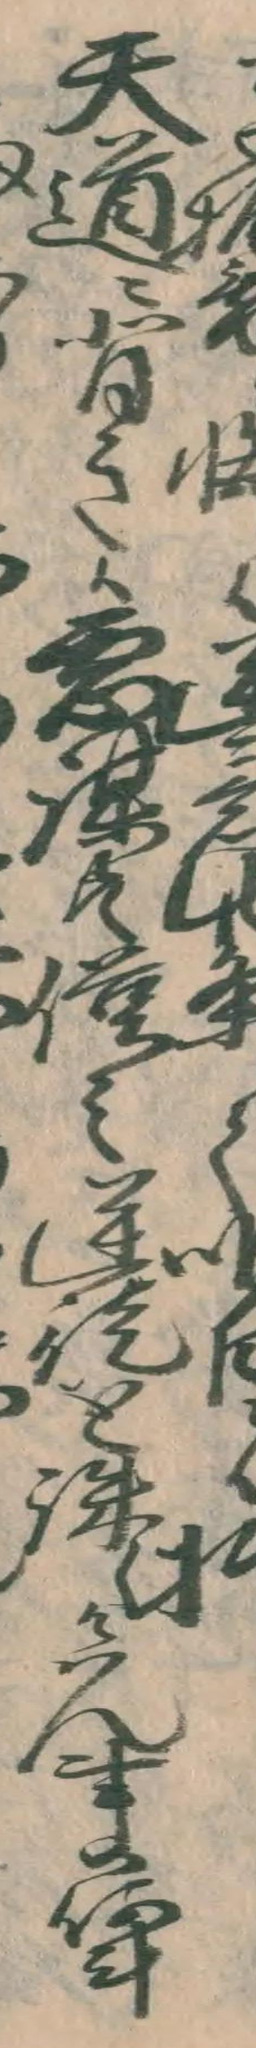天道ニ背き候悪謀共僅之逆徒を誅し候ハん事如何斗
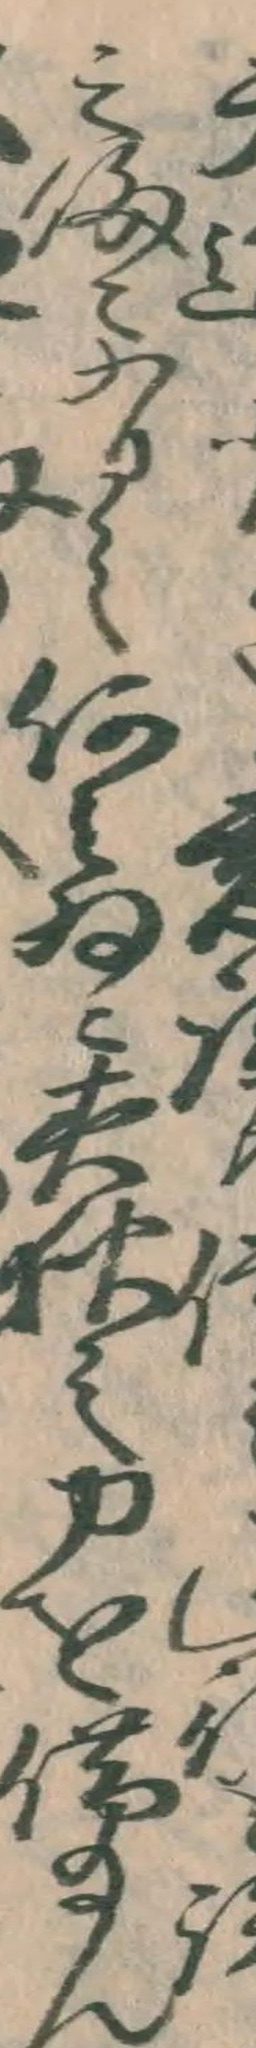之儀ニ有之何之為ニ夷狄之力を借なん
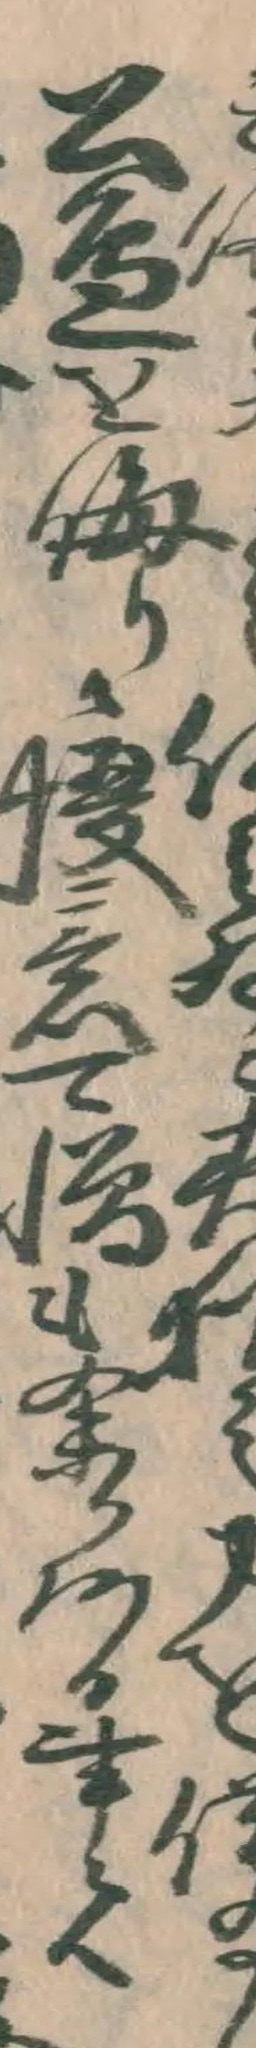公邊を侮り候慢意可憎も余りある事ニ候
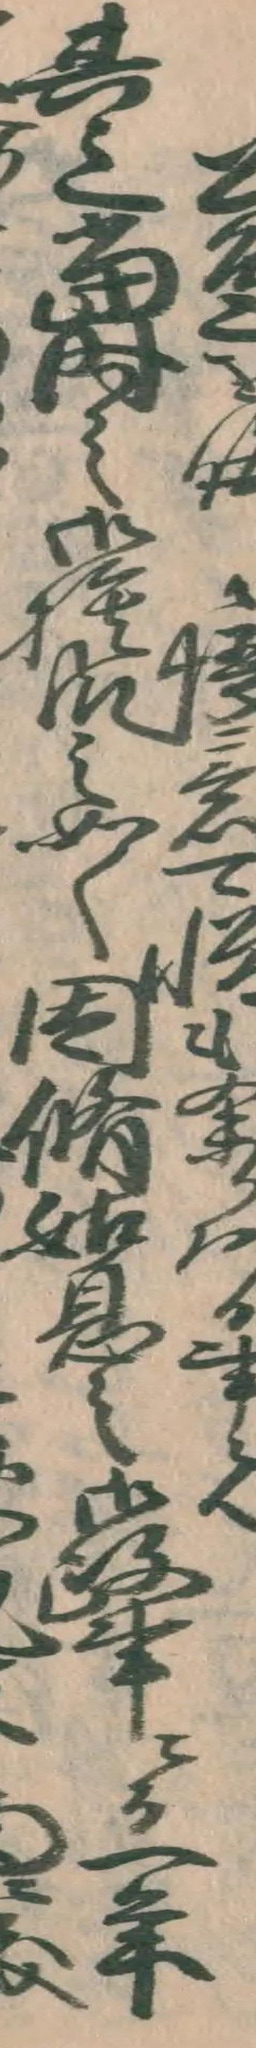其上當時之御模様之如く因脩姑息之御政事ニ而一年
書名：麗斎叢書. 20
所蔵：国立国会図書館 National Diet Library, JAPAN
